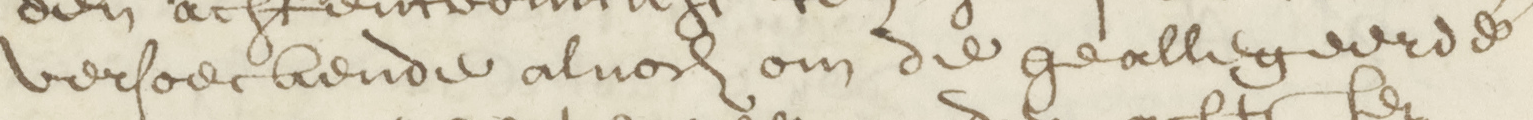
versoeckende alnoch om de geallegeerde
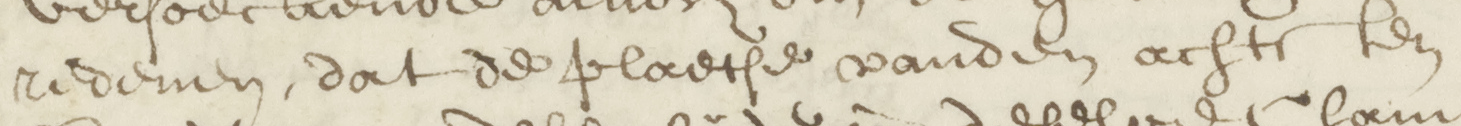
redenen, dat de plaetse vanden achtsten
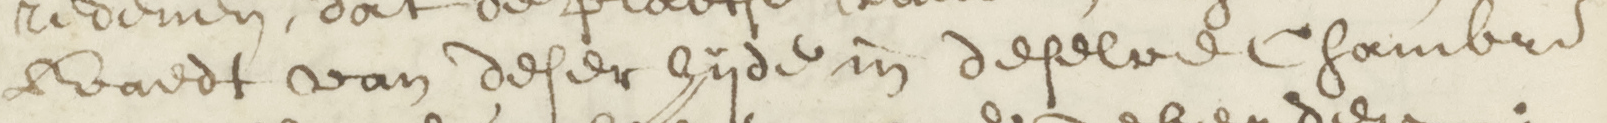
Raedt van deser zijde in deselve Chambre
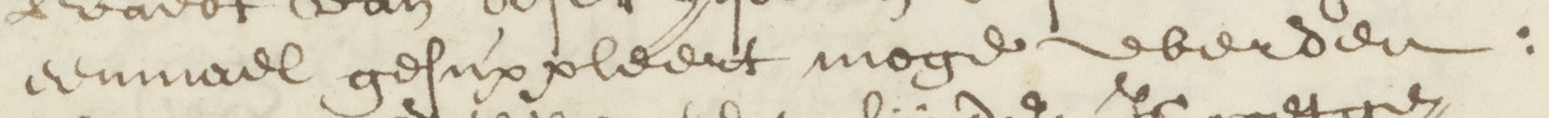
eenmael gesuppleert moge werden:
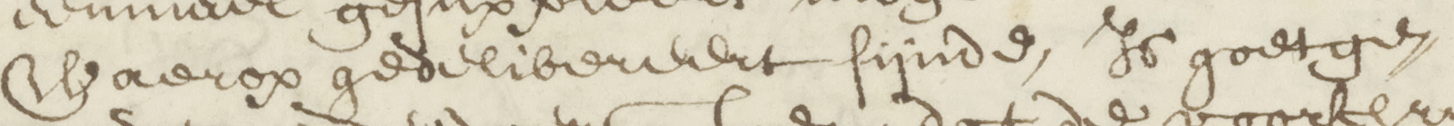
Waerop gedelibereert sijnde, Is goetge„
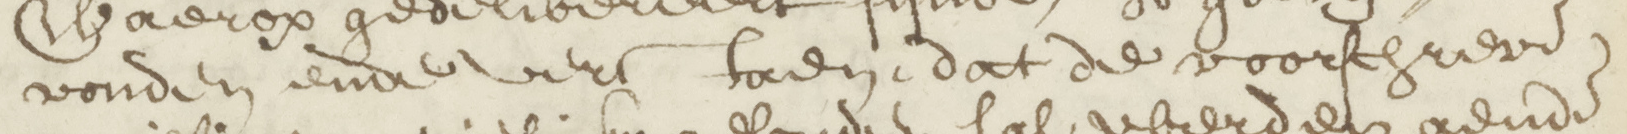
vonden ende verstaen, dat de voorschreve
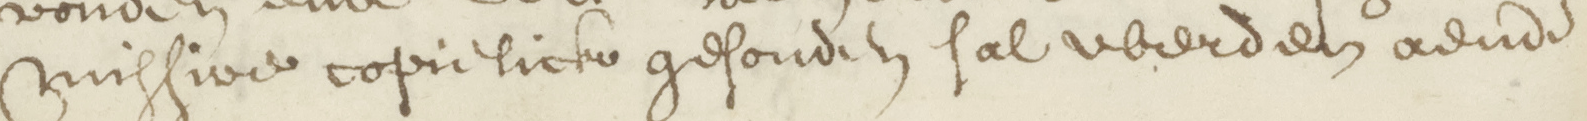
missive copielick gesonden sal werden aende
